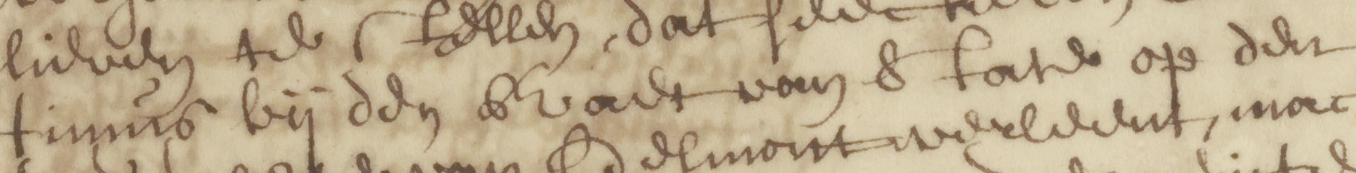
timus bij den Raet van State op den
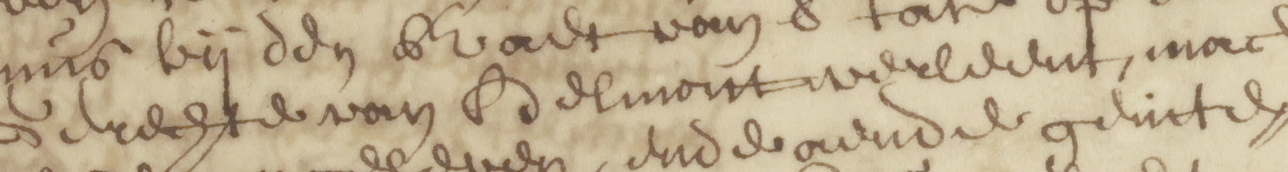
Gerechte van Helmont verleent, mach,
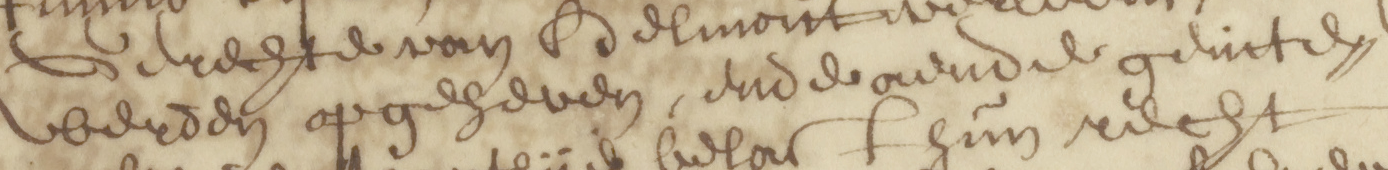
werden opgeheven, ende aende geinte„
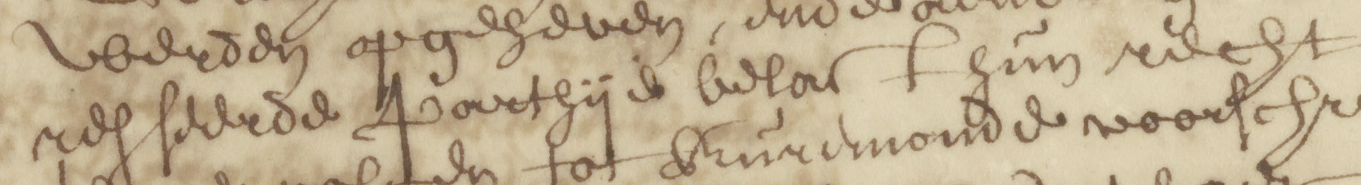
resseerde Parthije belast hun recht
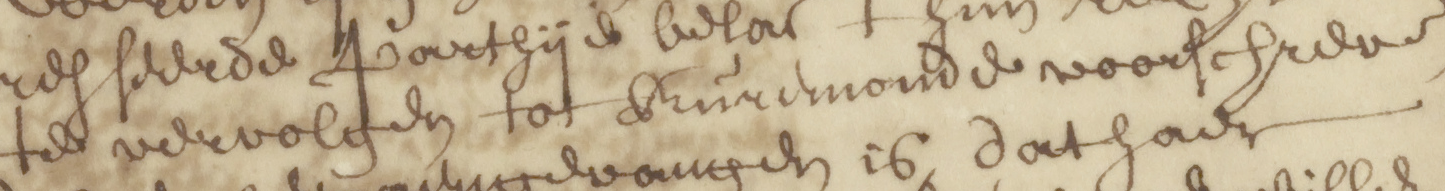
te vervolgen tot Ruremonde voorschreve,
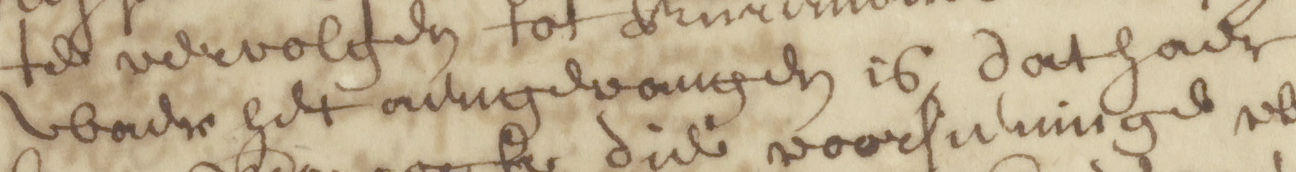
waer het aengevangen is dat haer
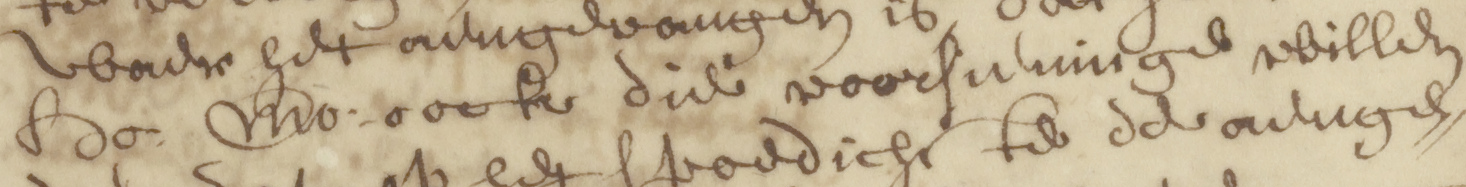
Ho:Mo: oock die voorsieninge willen
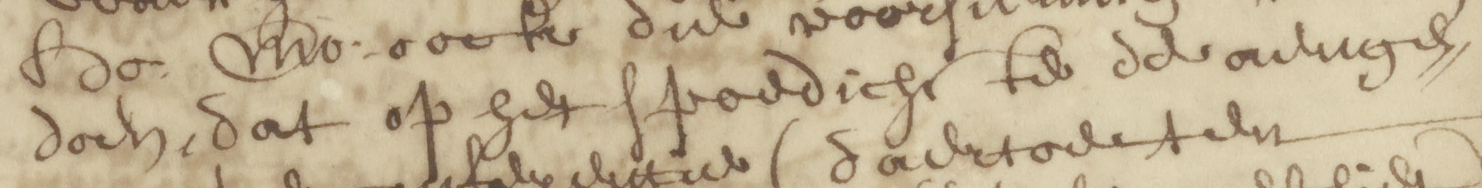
doen, dat op het spoedichste de aenge,,
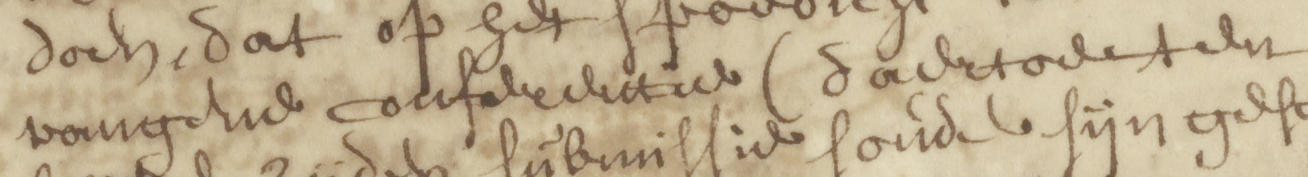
vangene conferentie (daertoe ten
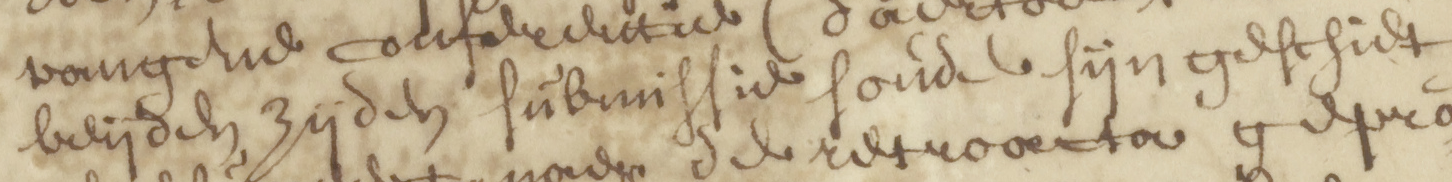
beijden zijden submissie soude sijn geschiet)
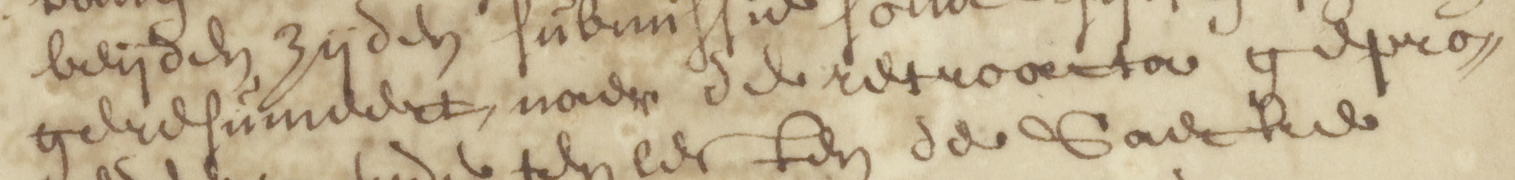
geresumeert, naer de retroacta gepro,,
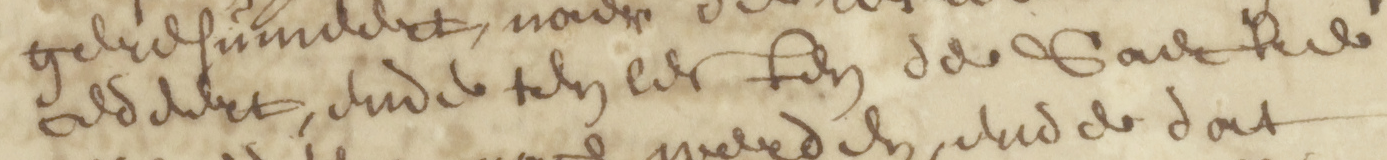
cedeert, ende ten lesten de Saecke
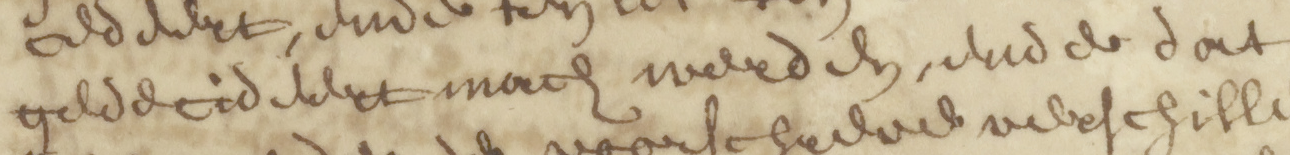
gedecideert mach werden, ende dat
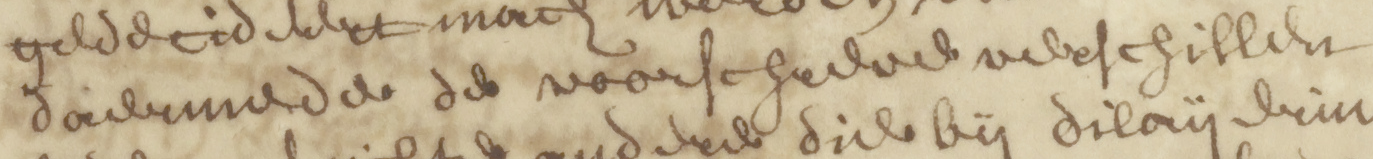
daermede de voorschreve verschillen
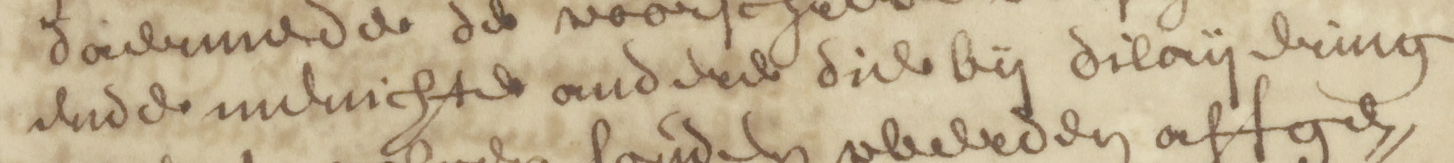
ende menichte andere die bij dilaijeringe
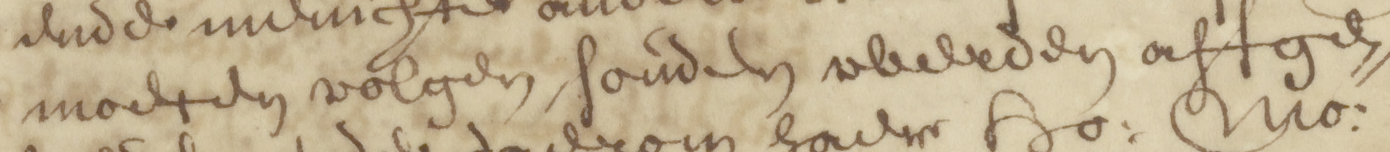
moeten volgen, souden werden affge,,
